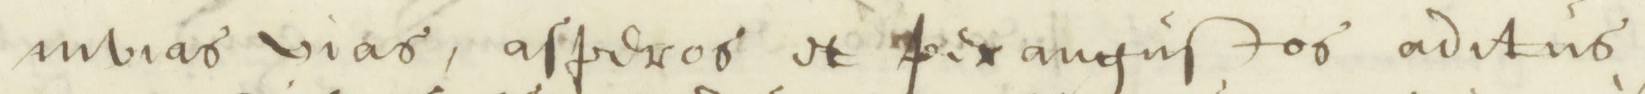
invias vias, asperos et per augustos aditus
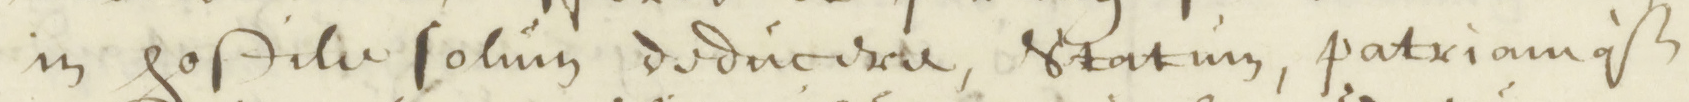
in hostile solum deducere, statum, patriamq
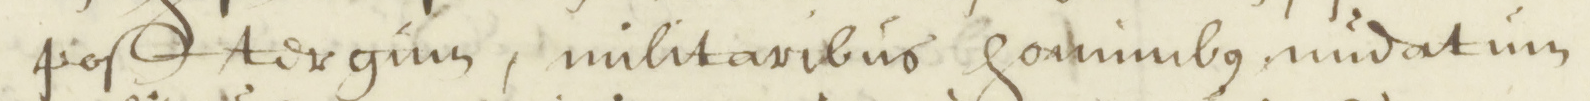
post tergum, militaribus hominibq, nudatum
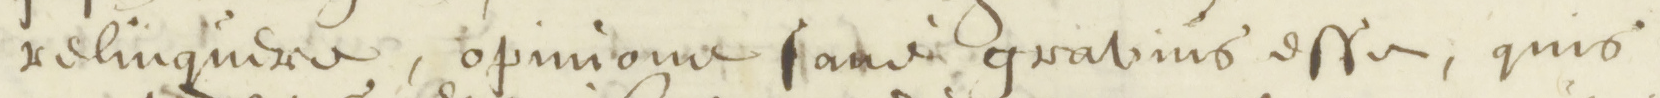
relinquere, opinione sane gravius esse, quis
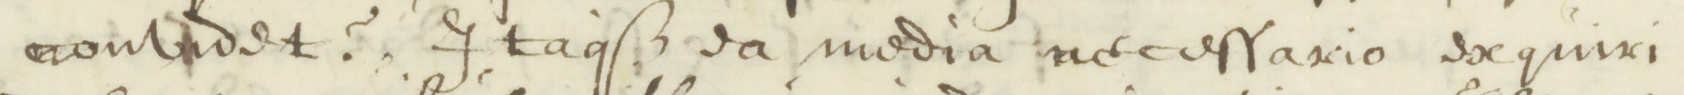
convidet. Itaq ea media necessario exquiri
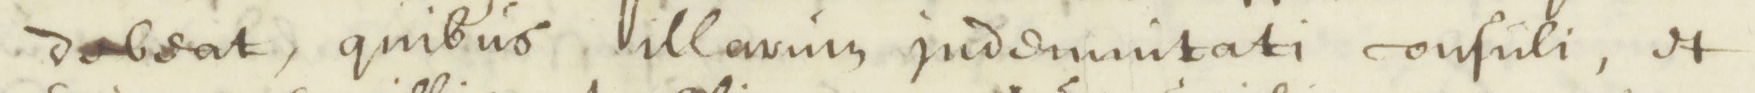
debeat, quibus illarum indemnitati consuli, et
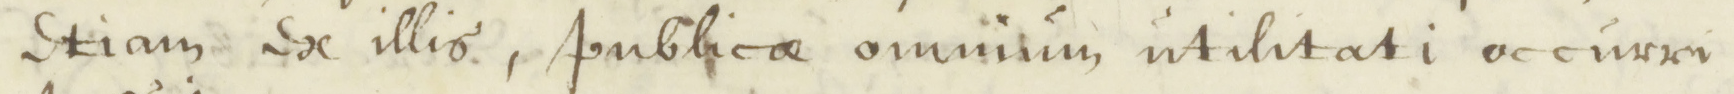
etiam ex illis, publicæ omnium utilitati occurri
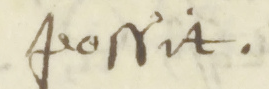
possit.
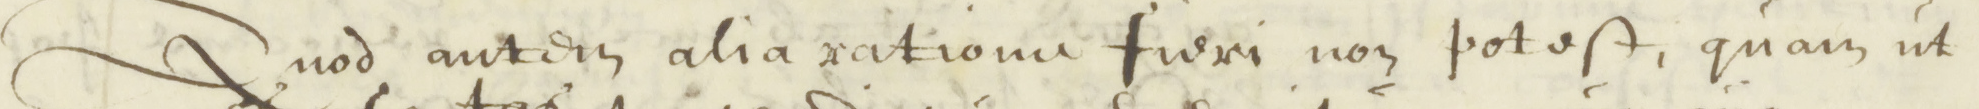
Quod autem alia ratione fieri non potest, quam ut
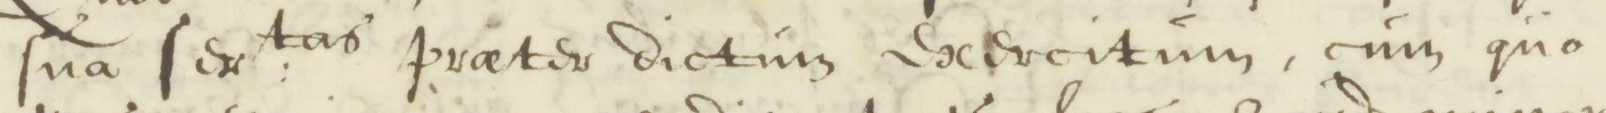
sua sertas præter dictum exercitum, cum quo
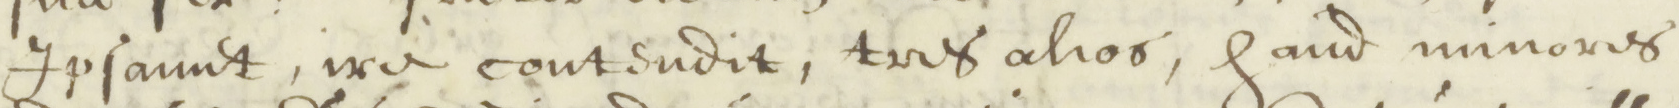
Ipsamet, ire contendit, tres alios haud minores
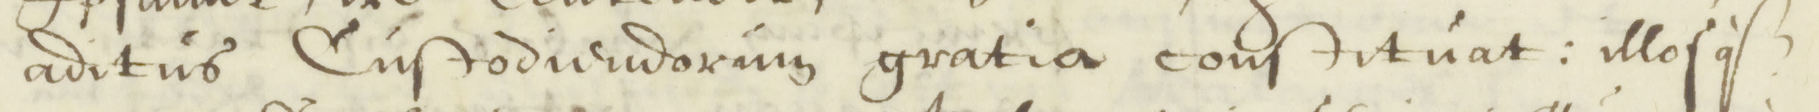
aditus Custodiendorum gratia constituat: illosq
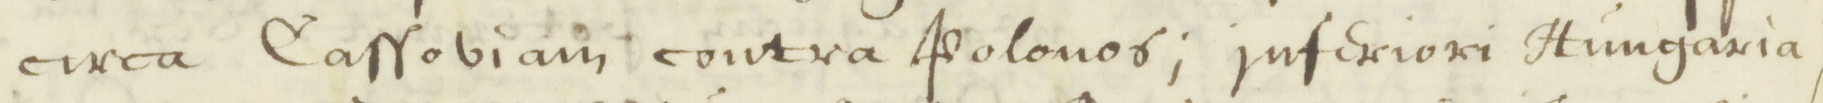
circa Cassoviam contra Polonos; inferiori Hungaria
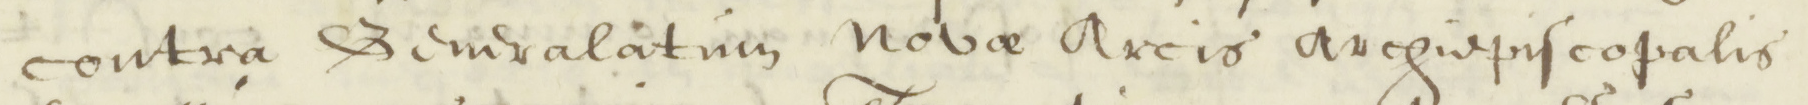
contra Generalatum novæ Arcis Archiepiscopalis
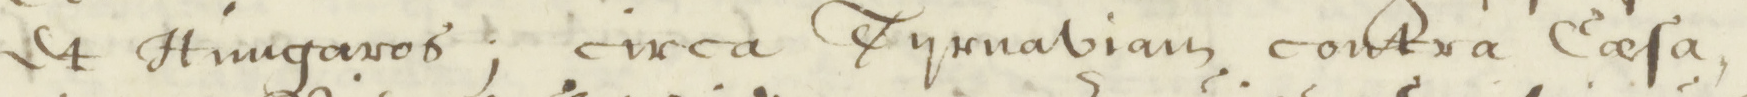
et Hungaros circa Tyrnaviam contra Cæsa,
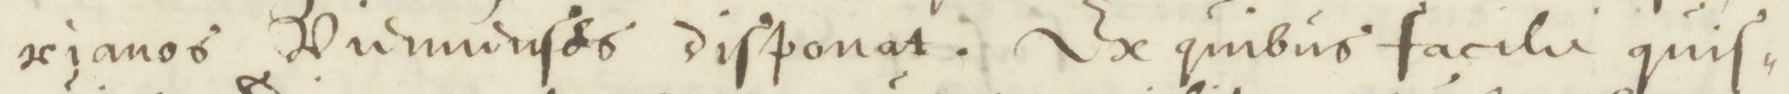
rianos Viennenses disponat. Ex quibus facile quis„
